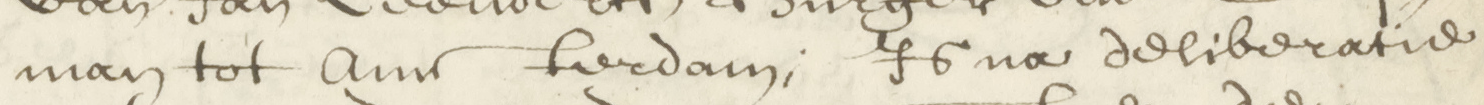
man tot Amsterdam; Is na deliberatie
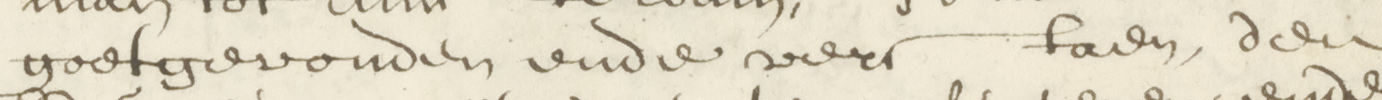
goetgevonden ende verstaen, den
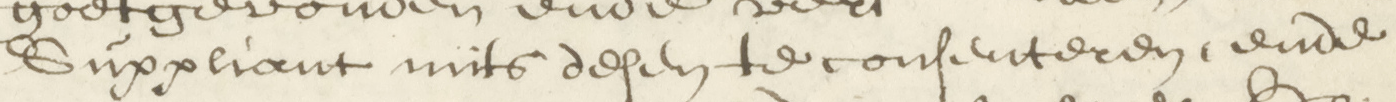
Suppliant mits desen te consenteren, ende
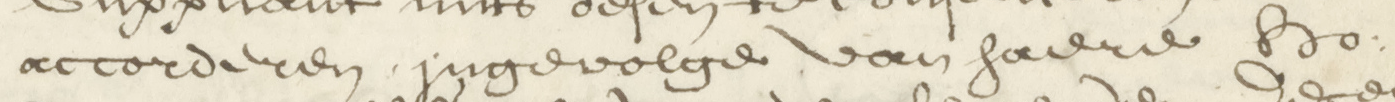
accorderen, ingevolge van haere Ho:
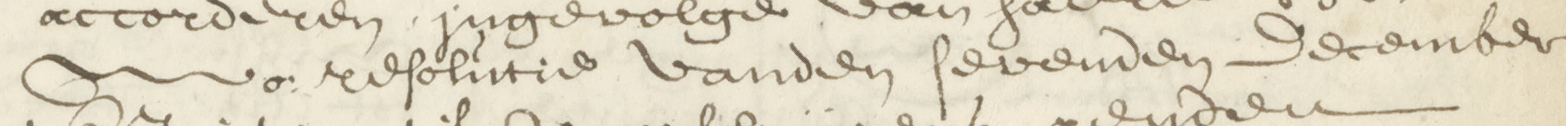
Mo: resolutie vanden sevenden December
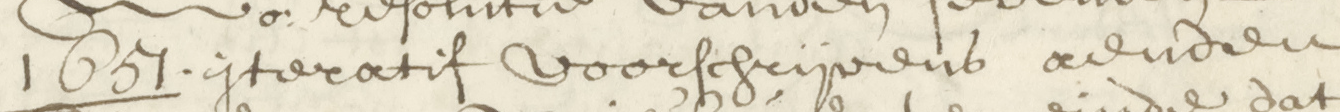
1651 iteratif voorschrijvens aenden
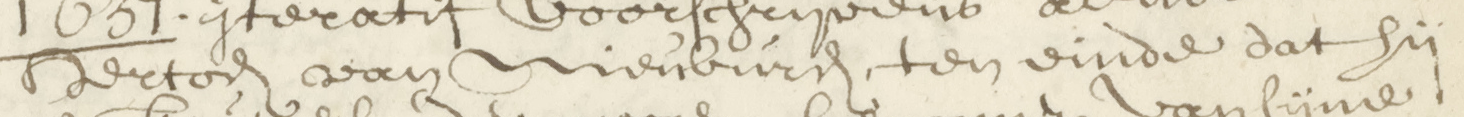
Hertoch van Nieuburch ten einde dat hij
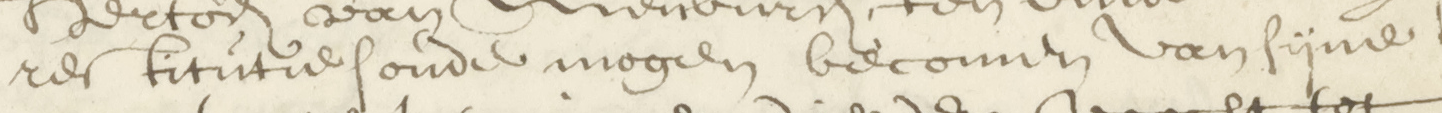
restitutie soude mogen becomen van sijne
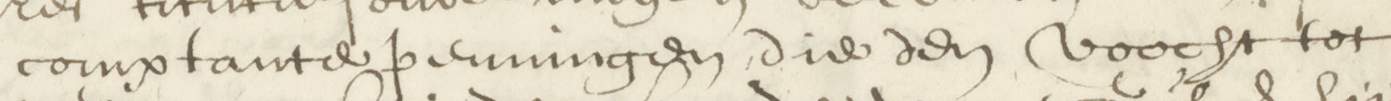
comptante penningen, die den voocht tot
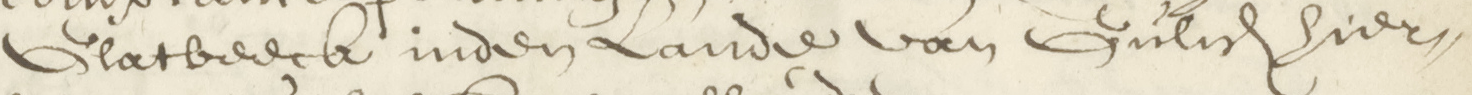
Glatbeeck inden Lande van Gulich hier„
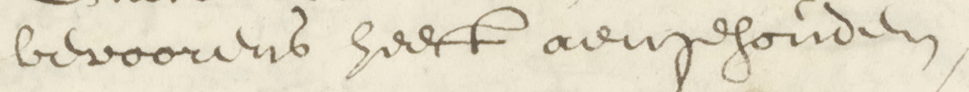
bevoorens heeft aengehouden.
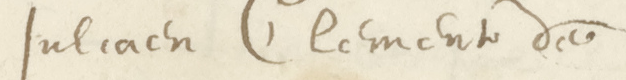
Juliaen Clement de
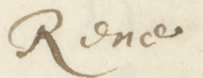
Rene
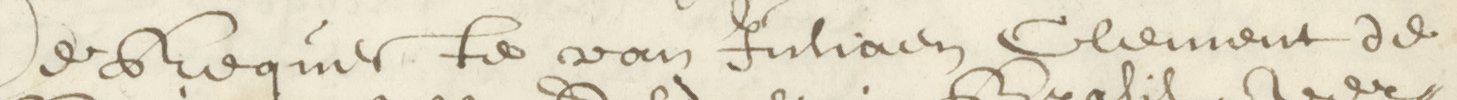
De Requeste van Juliaen Clement de
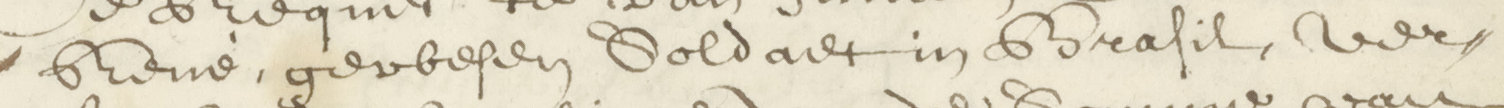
René, gewesen Soldaet in Brasil, ver„
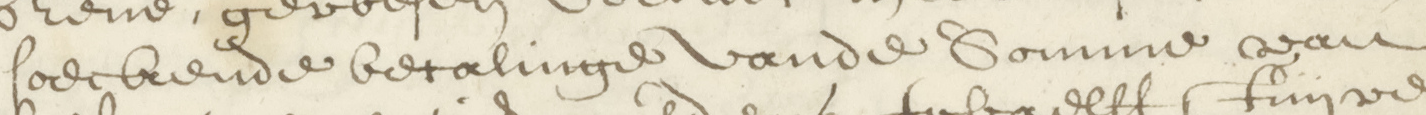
soeckende betalinge vande Somme van
